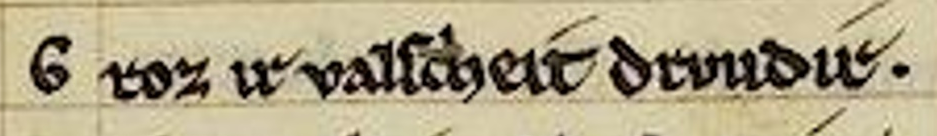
Groz ir valſcheit drvndir.
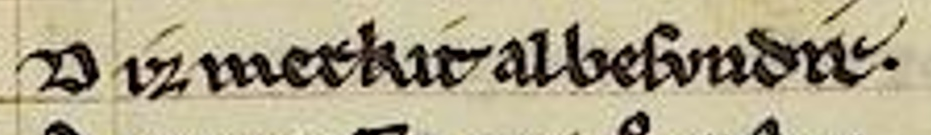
Diz merkit al beſvndir.
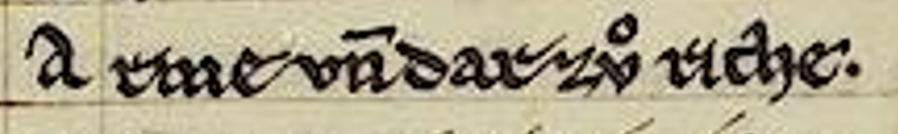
Arme vn(d) dar zv°o riche.
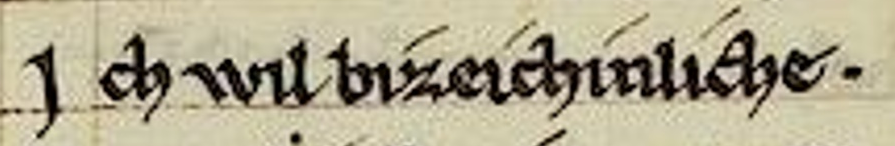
Ich wil bizeichinliche.
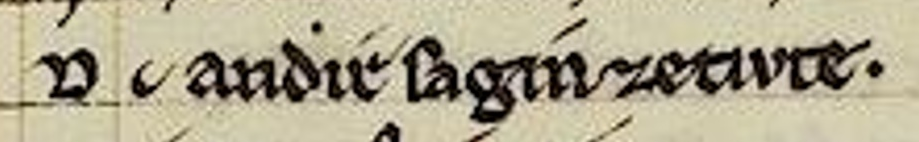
D(az) andir ſagin zetivte.
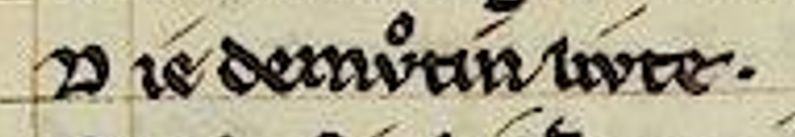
Die demv°otin livte.
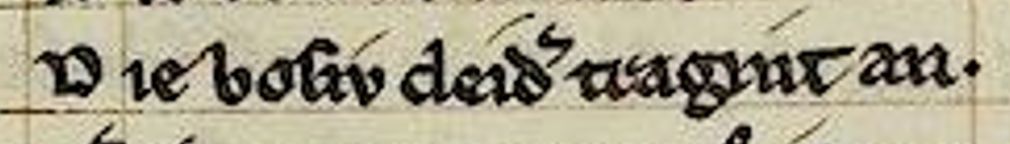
Die boſiv cleid(er) tragint an.
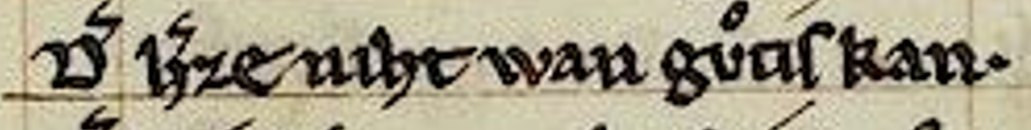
D(er) h(er)ze niht wan gv°otiſ kan.
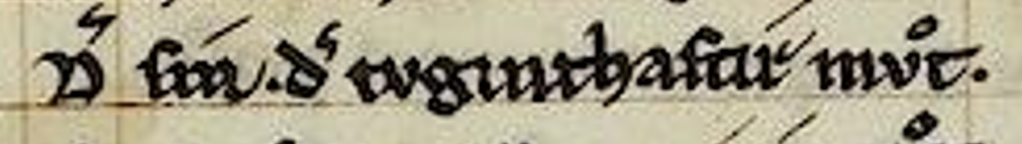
D(er) ſin. d(er) tvginthaftir mv°ot.
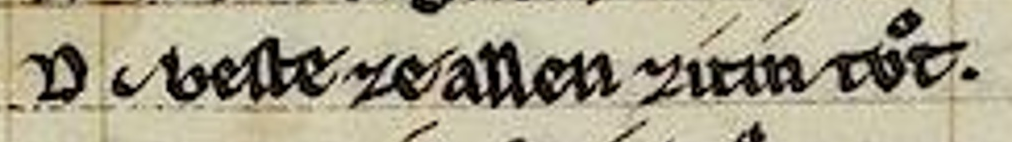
D(az) beſte ze allen zitin tv°ot.
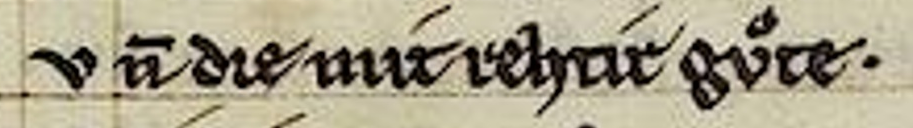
Vn(d) die mit rehtir gv°ote.
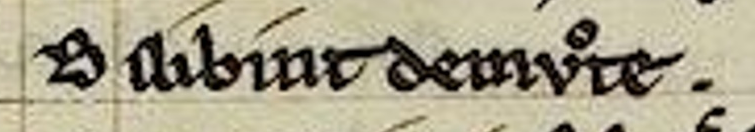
Bilibint demv°ote.
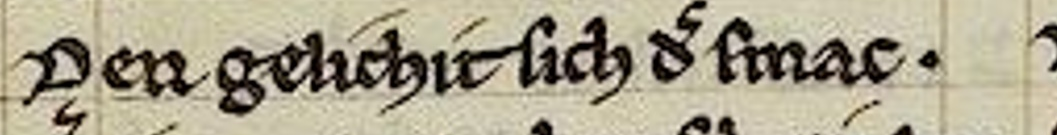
Den gelichit ſich d(er) ſmac.
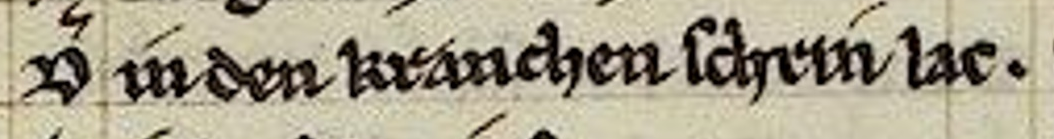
D(er) in den kranchen ſchrin lac.
